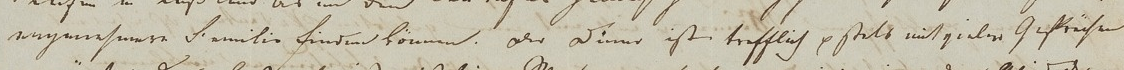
angenehmere Familie finden können. Das Diner ist trefflich & stets mit vielen Gesprächen
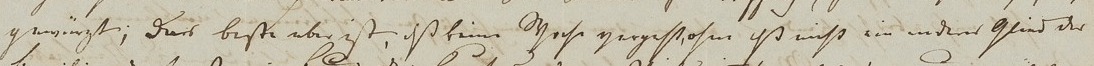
gewürzt; das beste aber ist, dß keine Woche vergeht, ohne dß nicht ein anderes Glied der
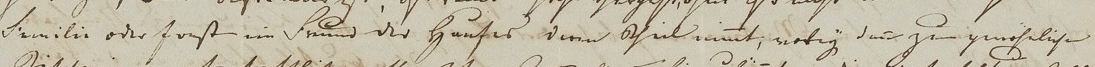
Familie oder sonst ein Freund des Hauses daran Theil nimmt, wobey dann zum gewöhnlichen
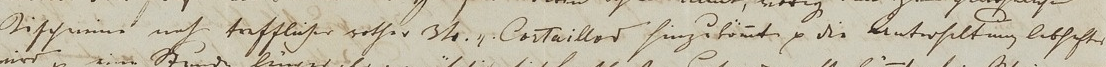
Tischweine noch trefflicher rother 34. v. Cortaillod hinzukömmt & die Unterhaltung lebhafter
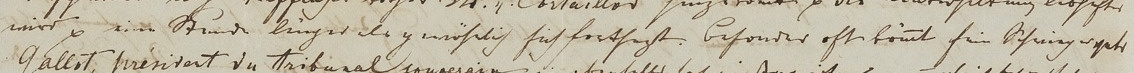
wird & eine Stunde länger als gewöhnlich sich fortsezt. Besonders oft kömmt sein Schwiegervater
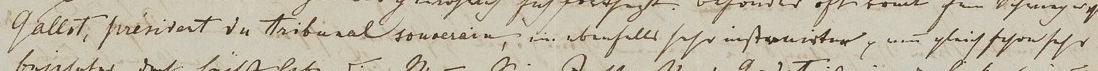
Gallot, président du tribunal souverain, ein ebenfalls sehr instruirter & wenn gleich schon sehr
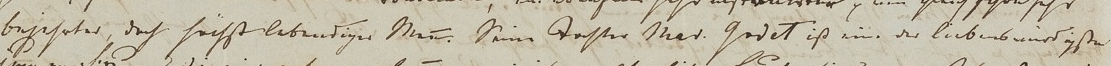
bejahrter, doch höchst lebendiger Mann. Seine Tochter Mad. Godet ist eine der liebenswürdigsten
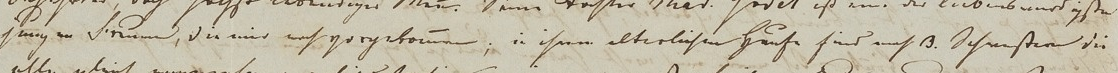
jungen Frauen, die mir noch vorgekommen; in ihrem elterlichen Hause sind noch 3. Schwestern die
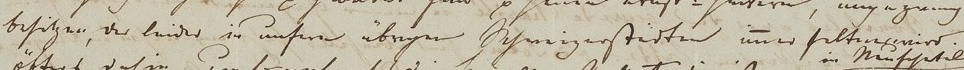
besitzen, der leider in unsern übrigen Schweizerstädten immer seltner wird.
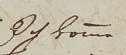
Ich komme
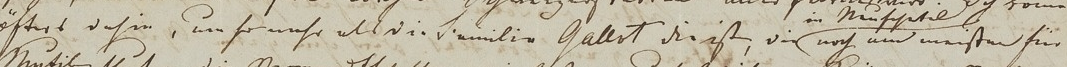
öfters dahin, um so mehr als die Familie Gallot die ist, die in Neuschatel noch am meisten für
